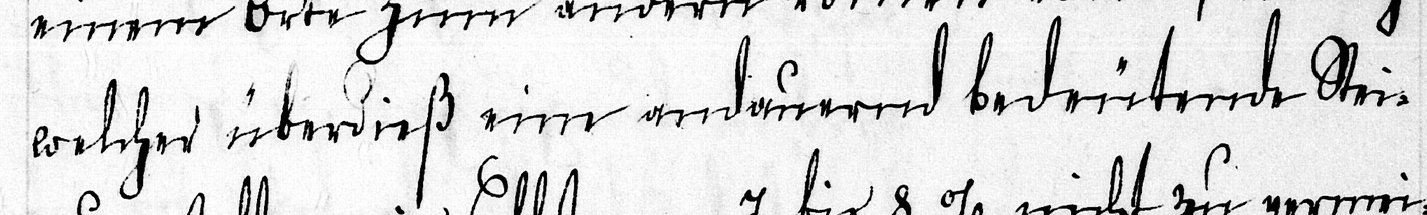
welcher überdieß eine andauernd bedeutende Stei¬
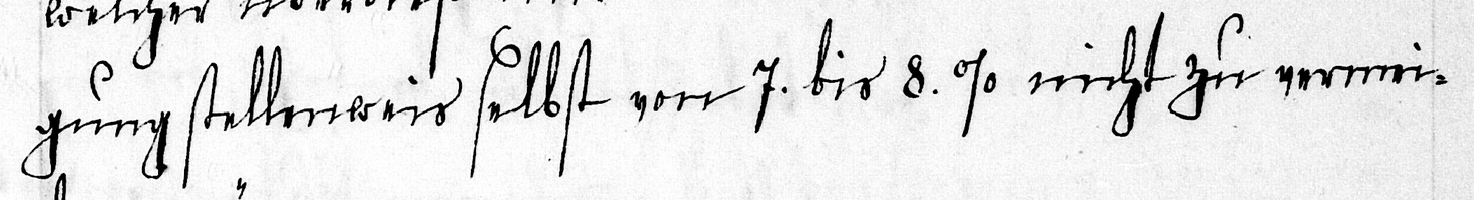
gung stellenweis selbst von 7. bis 8. % nicht zu vermei¬
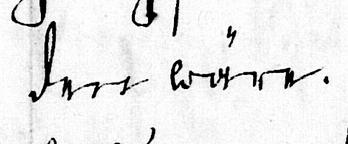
den wäre.
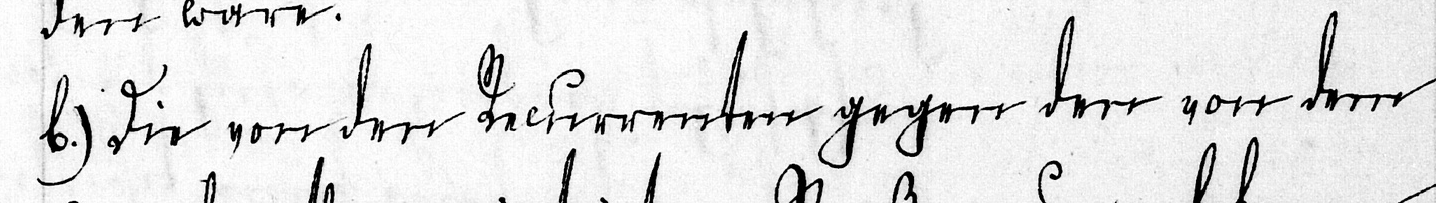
b.) Die von den Recurrenten gegen den von dem
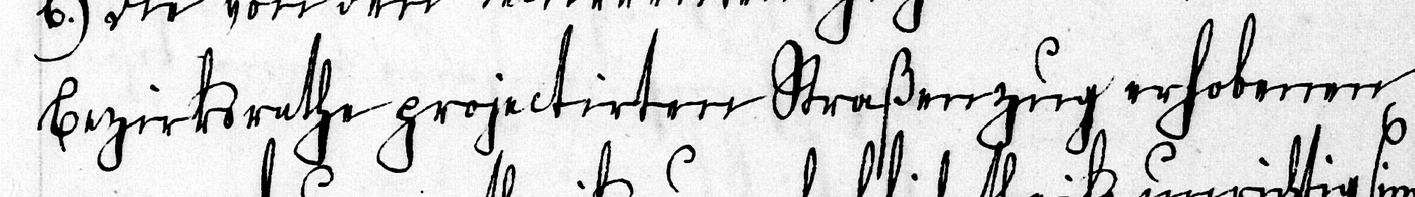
Bezirksrathe projectirten Straßenzug erhobenen
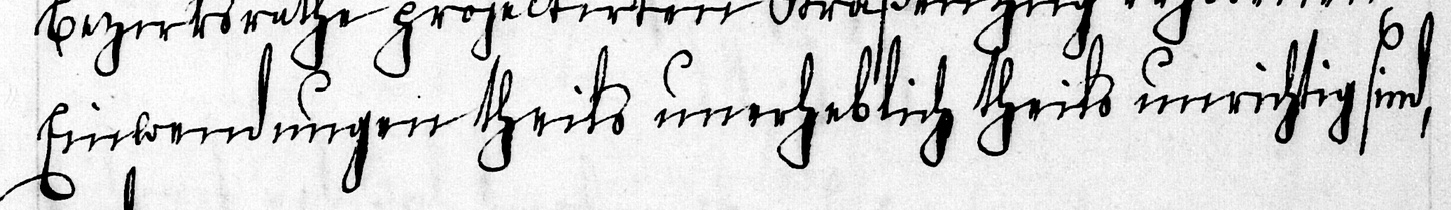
Einwendungen theils unerheblich theils unrichtig sin¬
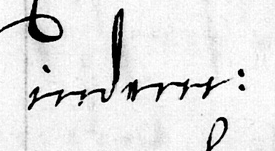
indem:
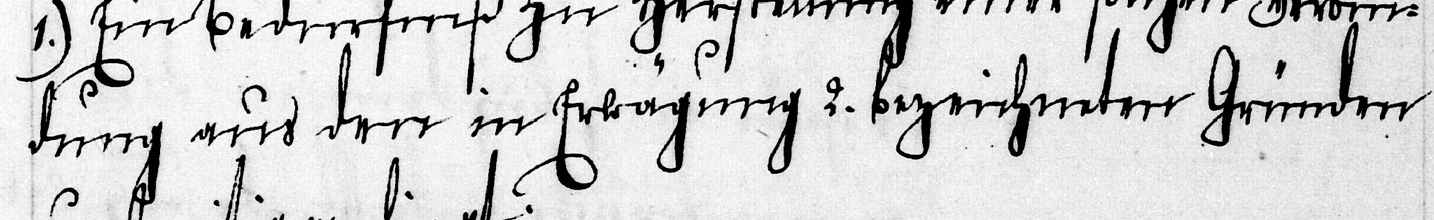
dung aus den in Erwägung 2. bezeichneten Gründen
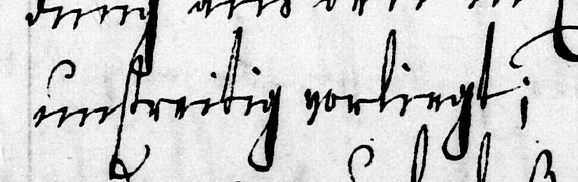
unstreitig vorliegt;
